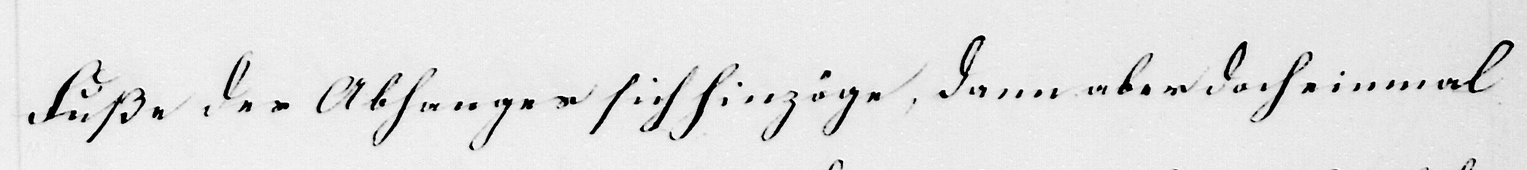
Fuße des Abhanges sich hinzöge, dann aber doch einmal
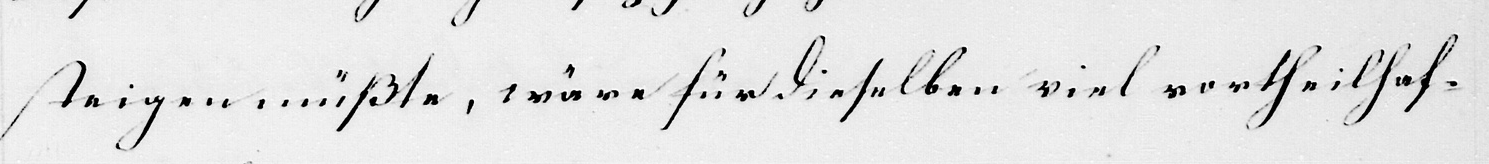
steigen müßte, wäre für dieselben viel vortheilhaf¬
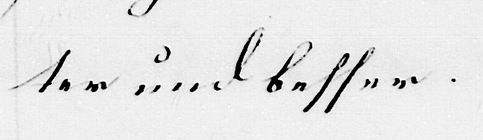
ter und besser.
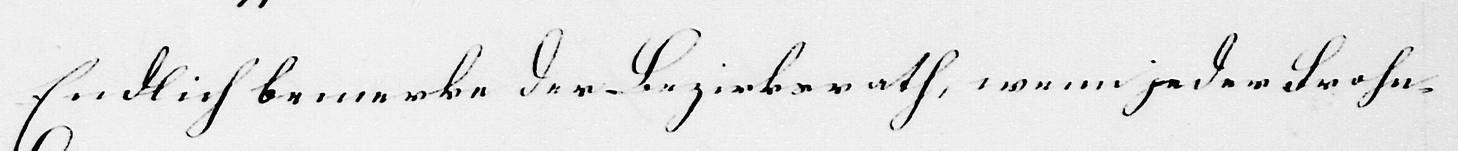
Endlich bemerke der Bezirksrath, wenn jeder Frohn¬
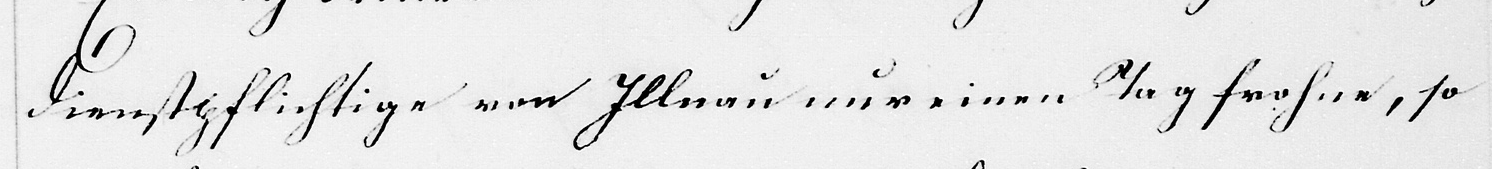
dienstpflichtige von Illnau nur einen Tag frohne, so
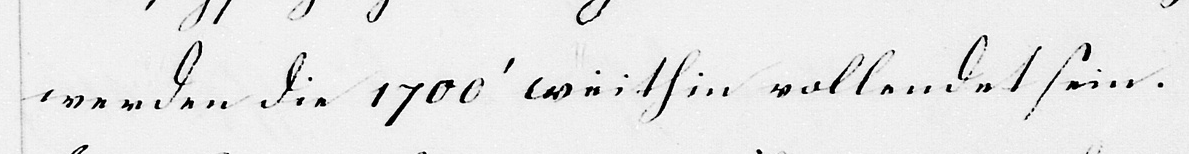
werden die 1700 [Fuss] weithin vollendet sein.
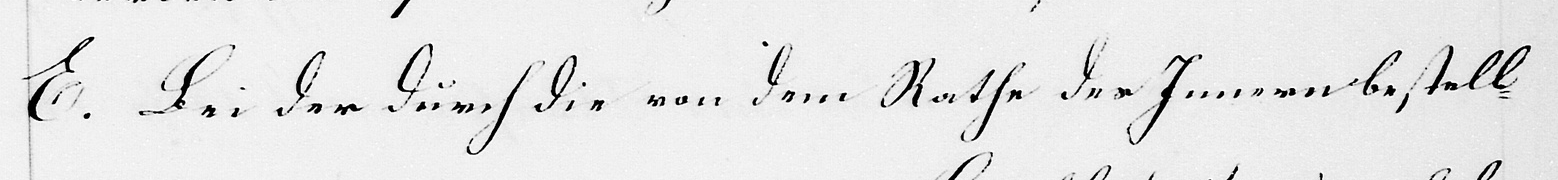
E. Bei der durch die von dem Rathe des Innern bestell¬
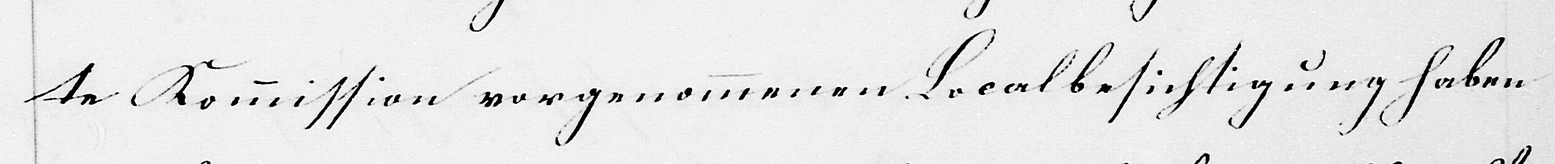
te Kommission vorgenommenen Localbesichtigung haben
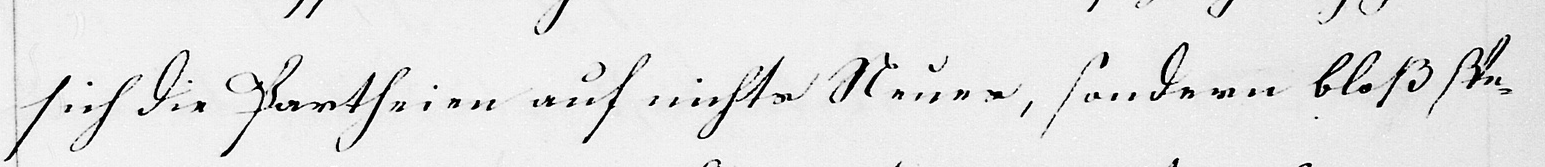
sich die Partheien auf nichts Neues, sondern bloß spe¬
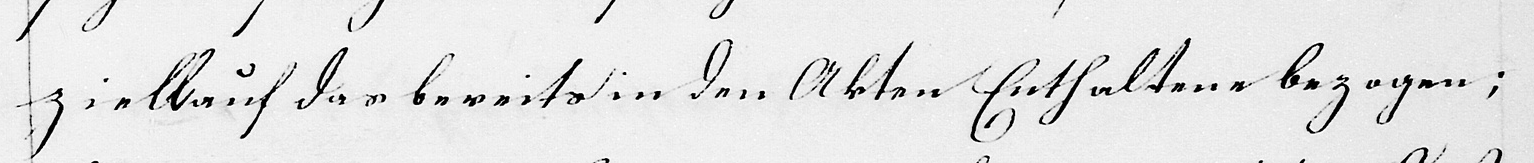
ziell auf das bereits in den Akten Enthaltene bezogen;
